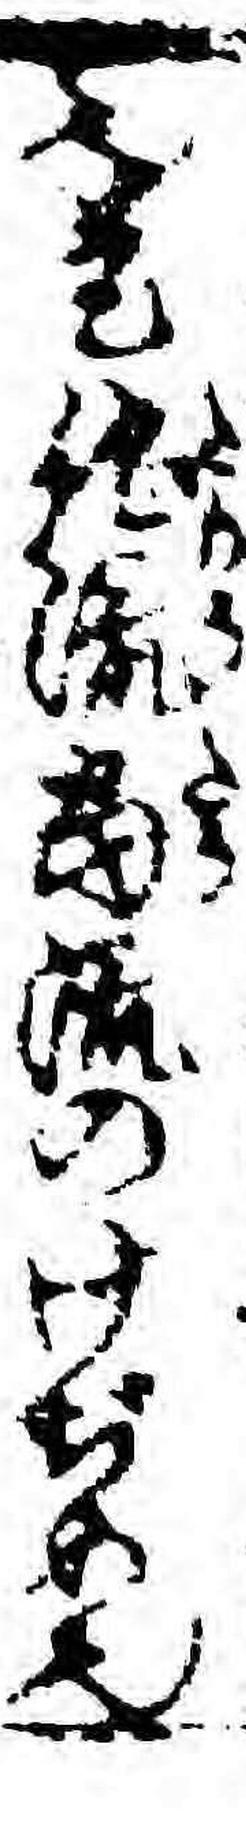也是他流当流のけじめ也
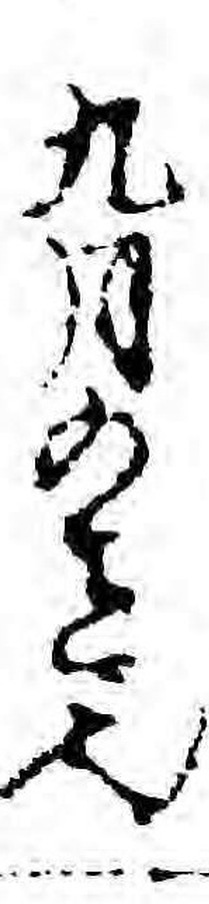九月のこと也
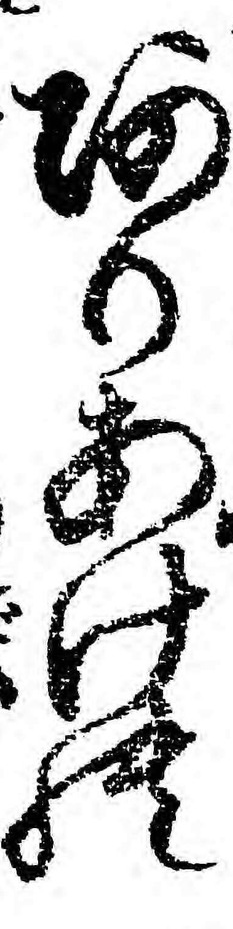ありあけの
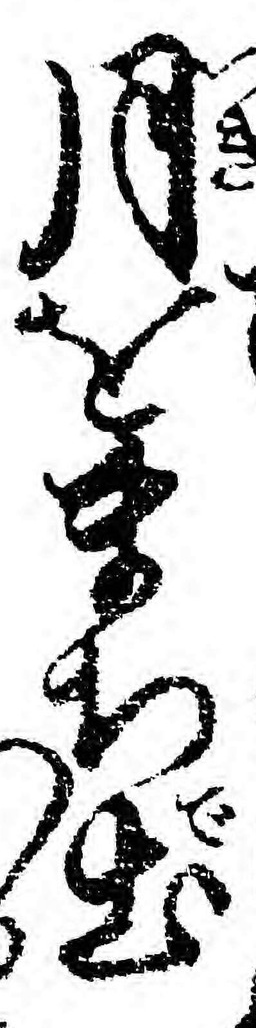月をまち出
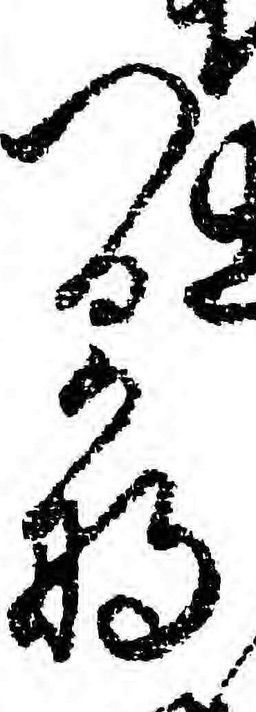つるかな

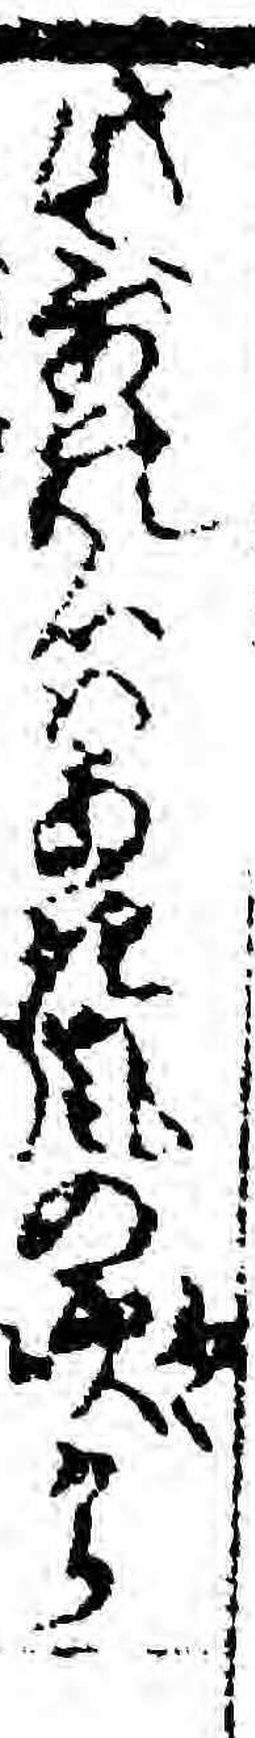此哥の心はあき風の吹から
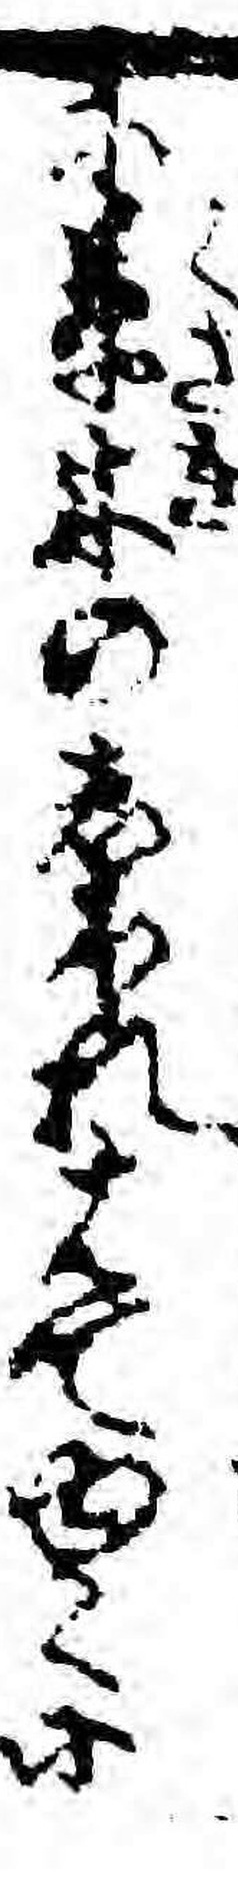に草木のしほれはてゆくに
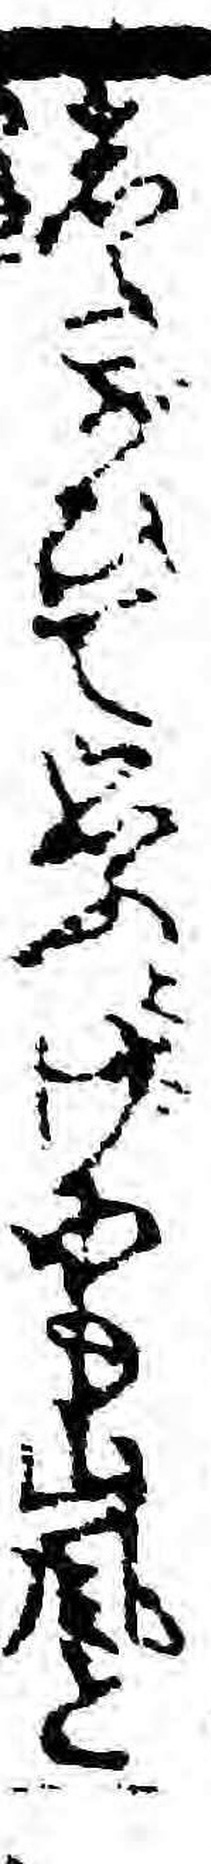したがひて思ふにげにも山風と
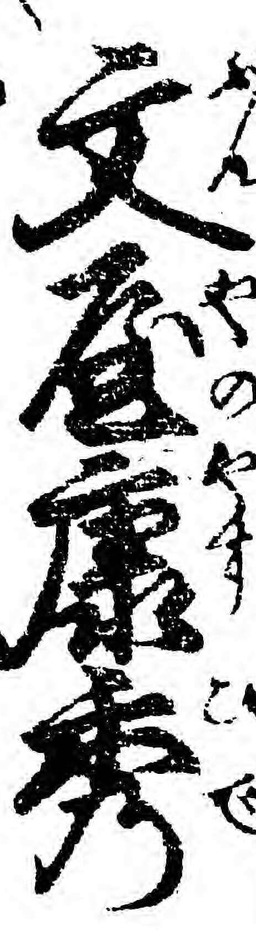文屋康秀
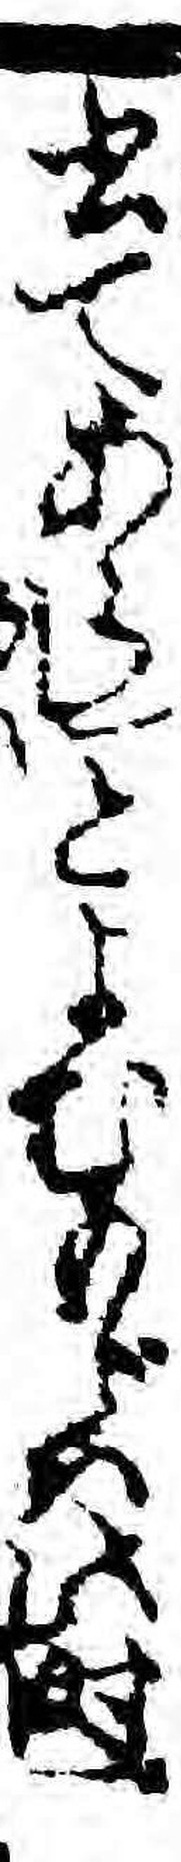書てあらしとよむもじは此時
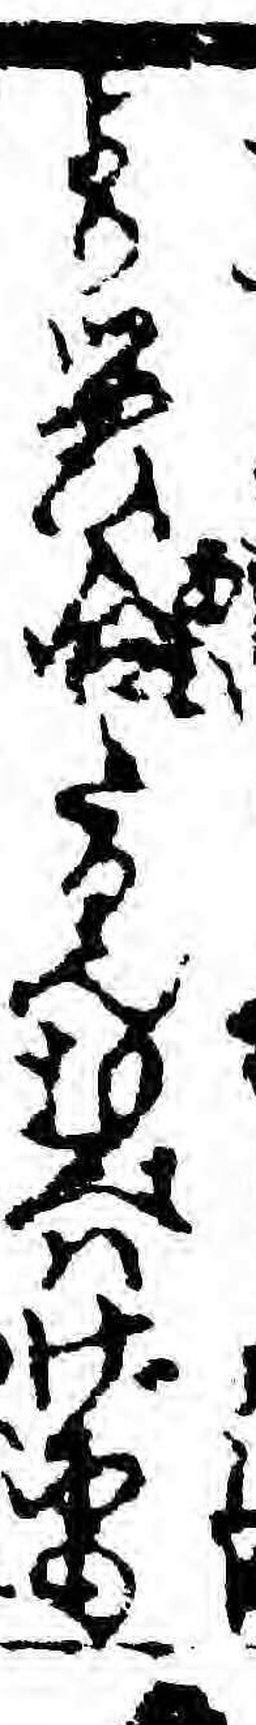より思ひ合たる也むべはげにも
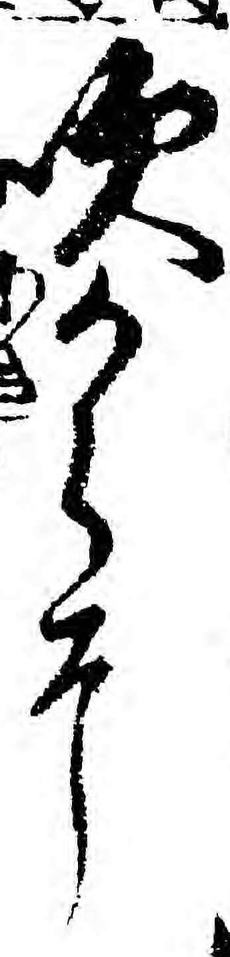吹からに
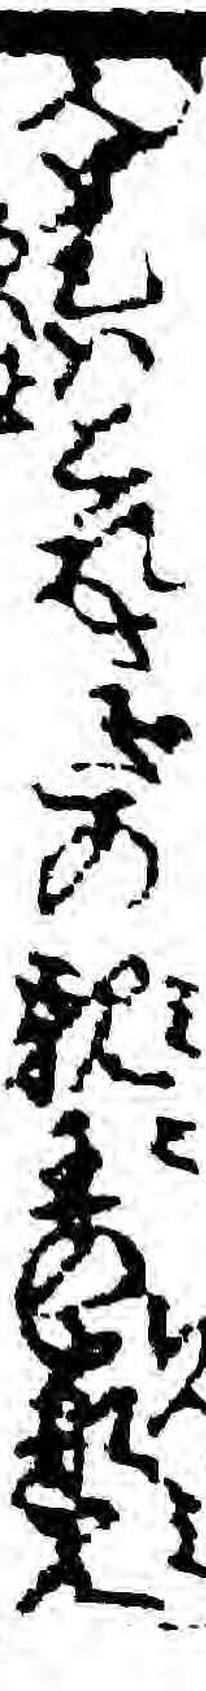也是はこれさだの親王の家見
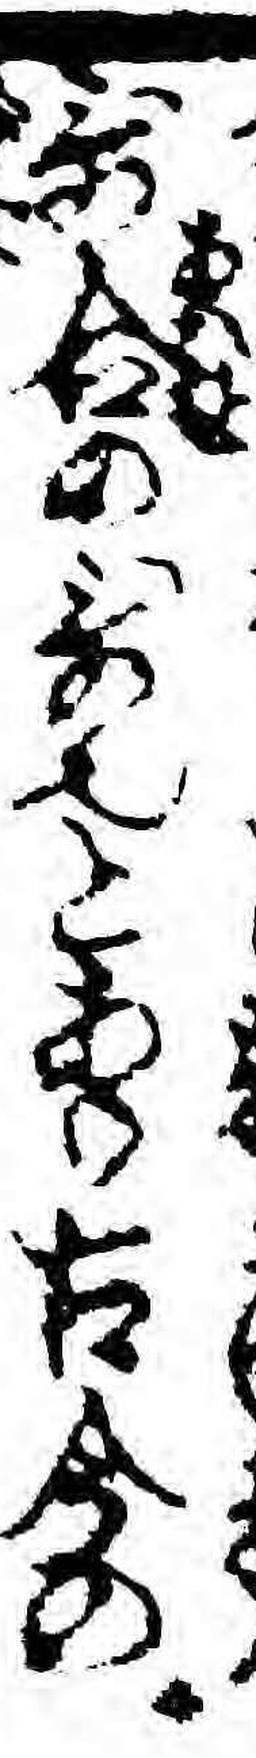哥合の哥也とあり古今の
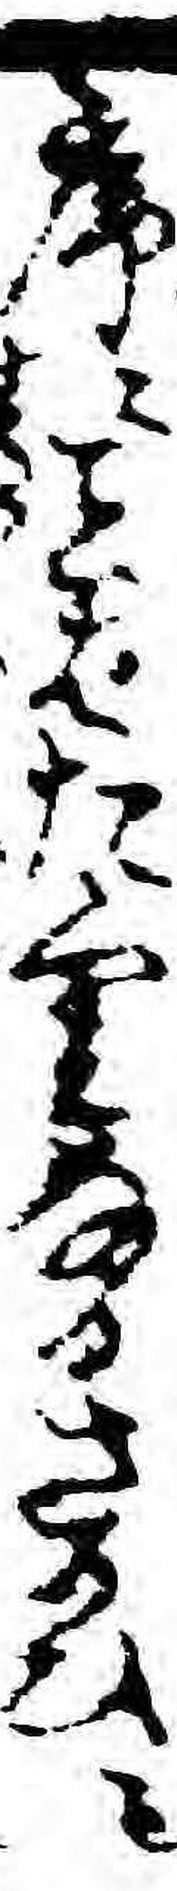序にことばたくみなるさかひに
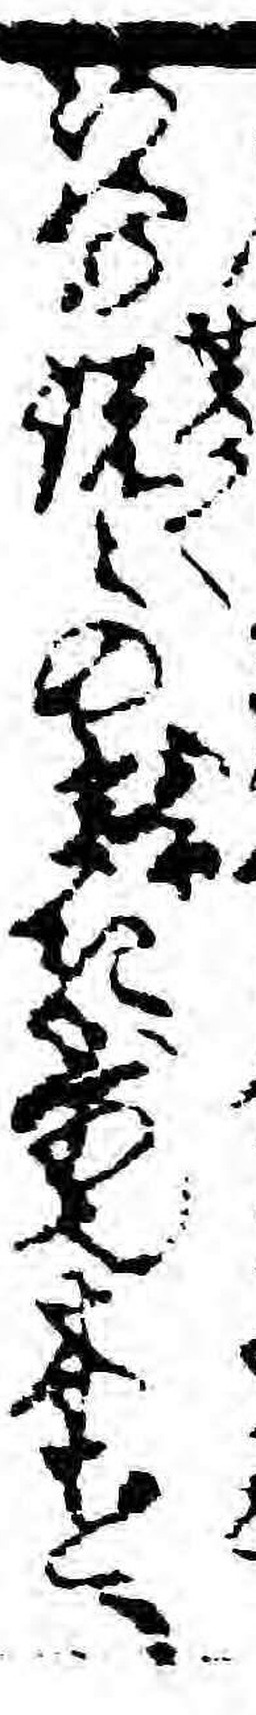いへり説々の多き哥也木ごとに
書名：頭書和歌注譯／壽賀多百人一首小倉錦
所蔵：国文学研究資料館
